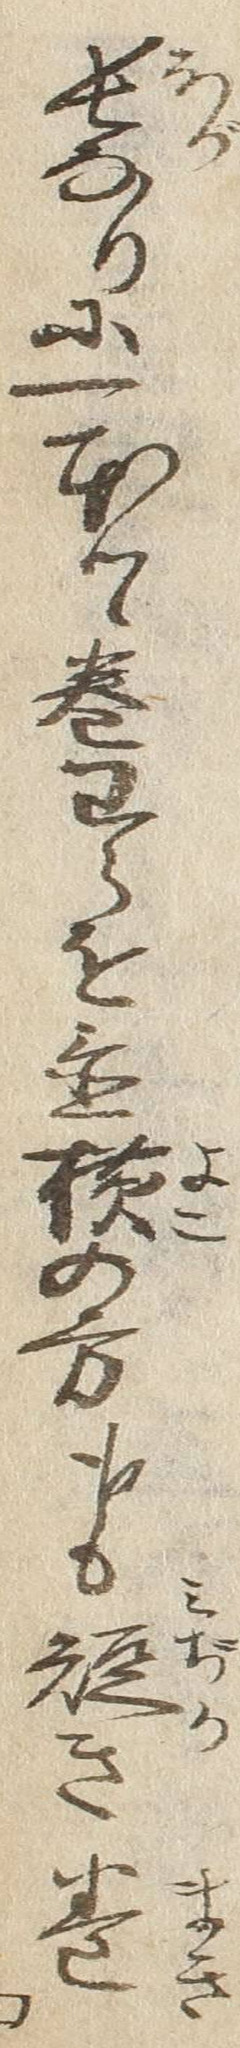長なり尓一本ツゝ巻わらを置横の方江も短き巻

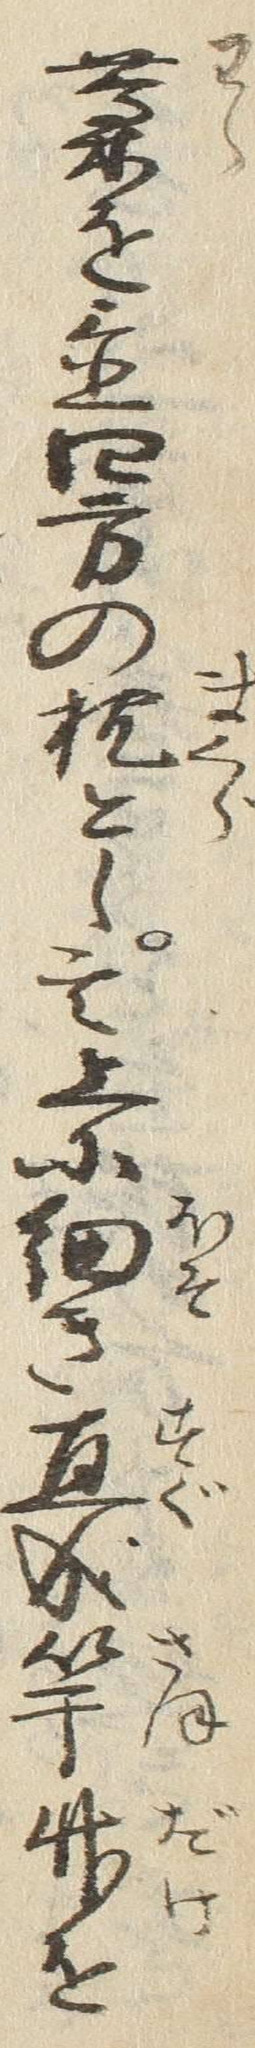藁を置四方の枕とし。其上尓細き直成竿竹を
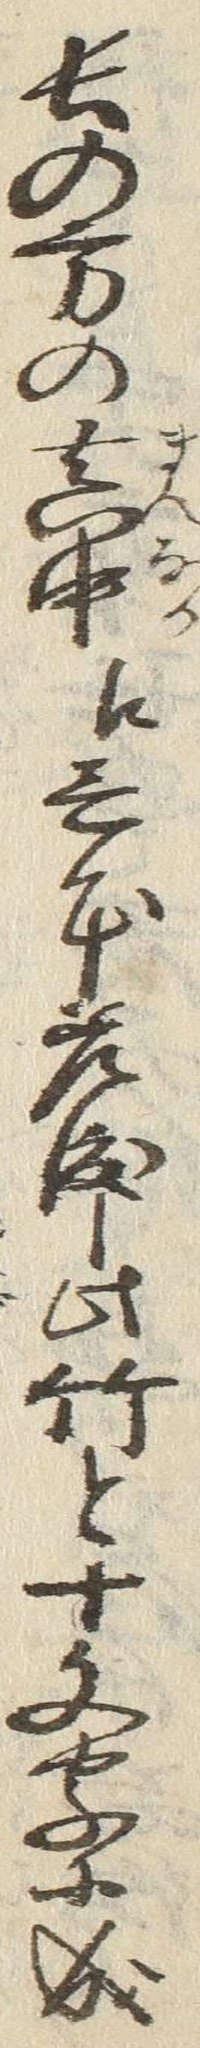長の方の真中江壱本差渡し此竹と十文字尓成
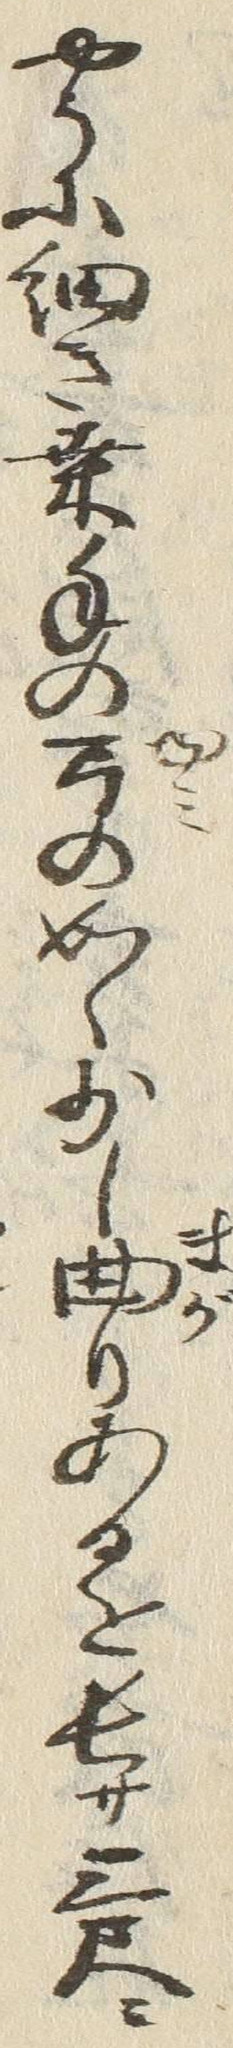やう尓細き桑手の弓の如く少し曲りあるを長サ三尺に
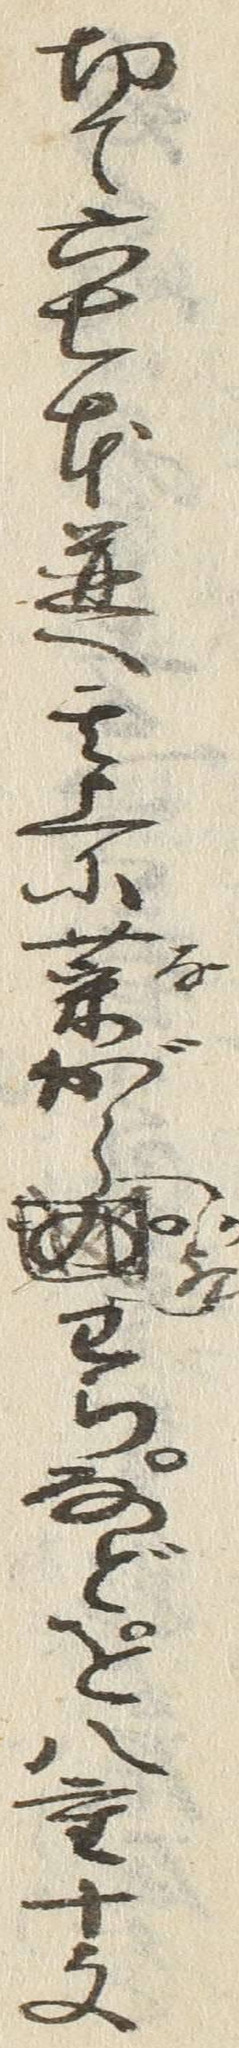切て六七本並へ其上尓菜がらの打わら。など。を八重十文
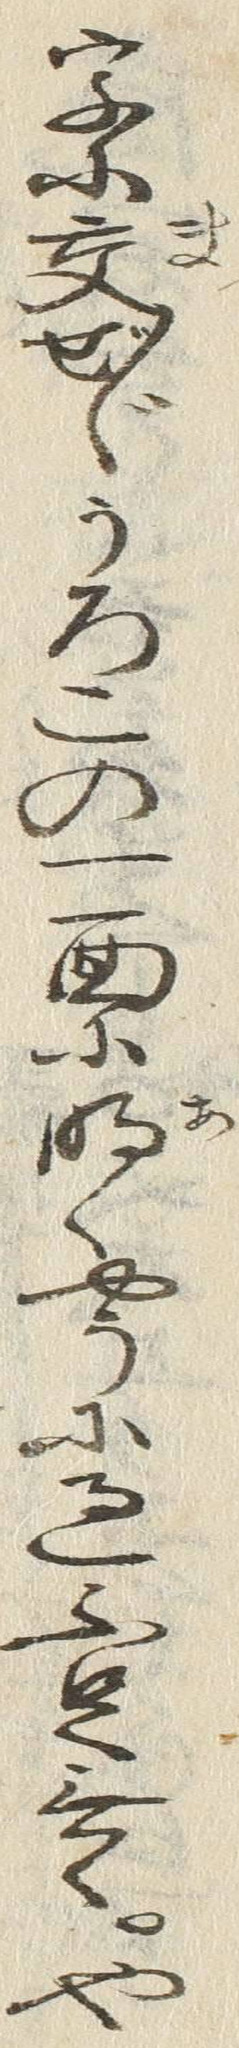字尓交ぜ〴〵うろこの一面尓明くやう尓過ふ足無く。や
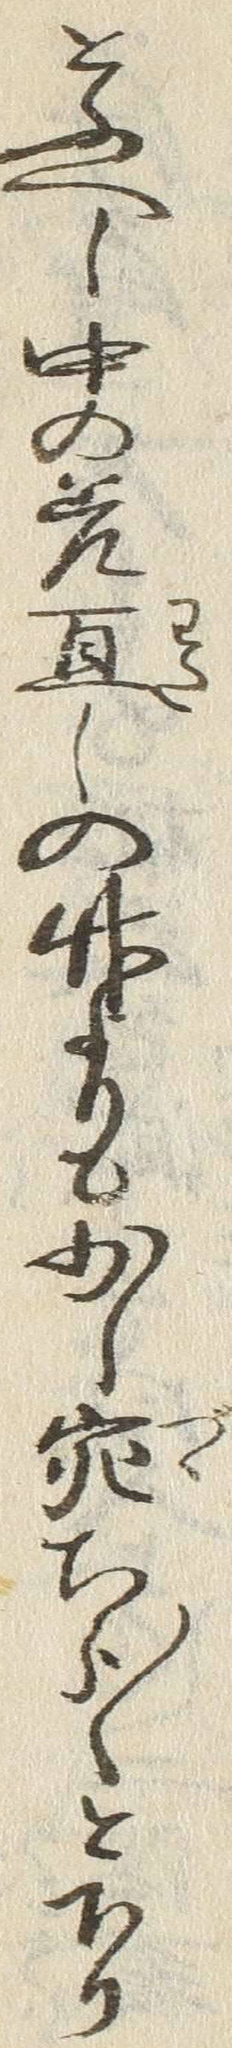とふへし中の差亘しの竹よりも少し宛ちら〳〵と下り
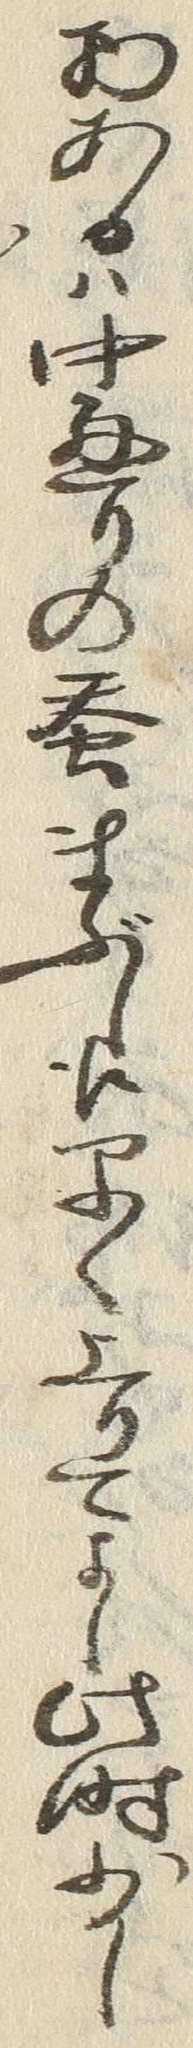物あるは中通りの蚕まぶし江早く上りてよし此時少し
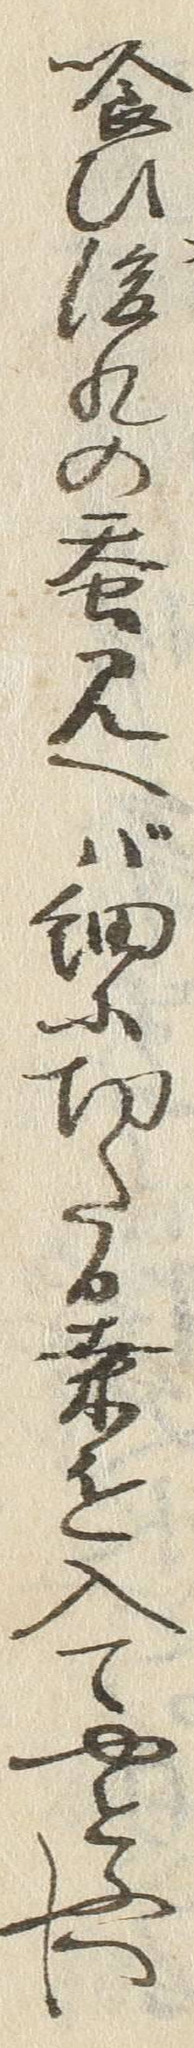喰ひ後れの蚕見へば細尓切たる桑を入てやとふへし
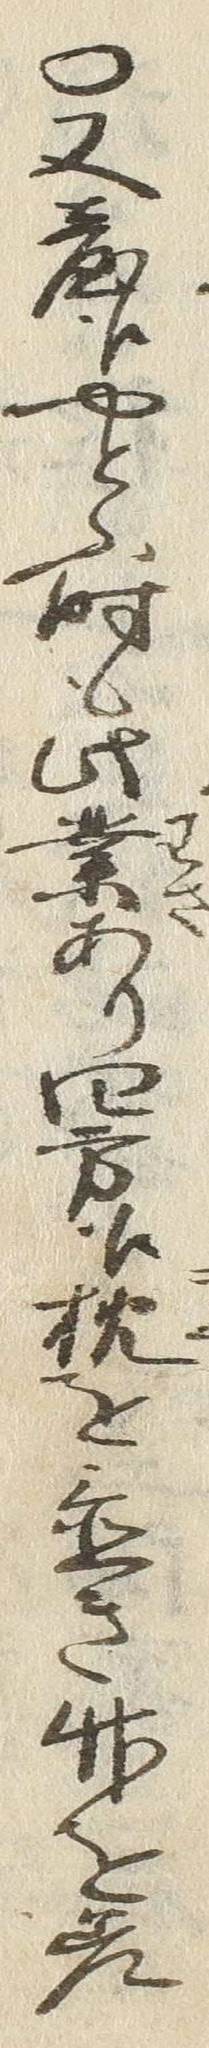〇又臺江やとふ時も此業あり四方江枕を置き竹を差
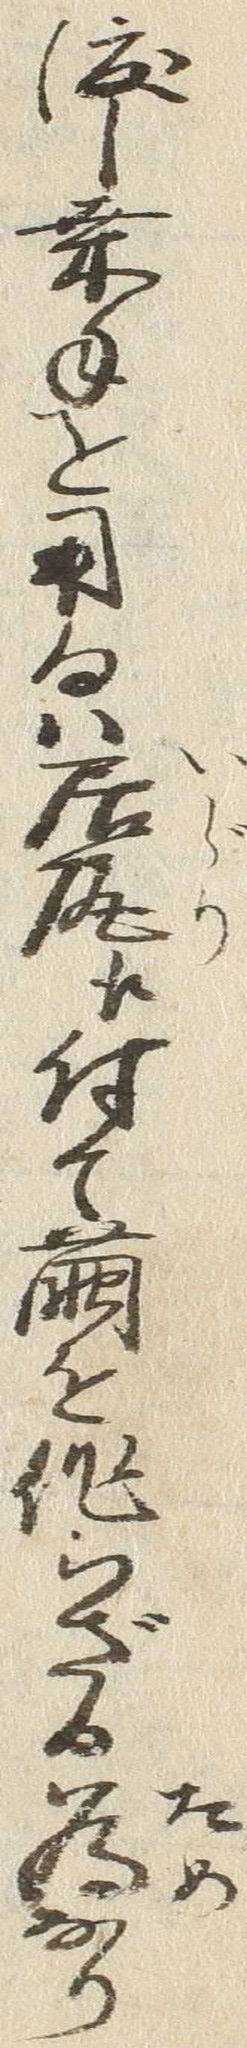渡し桑手を用るは居尻江付て繭を作らざる為なり
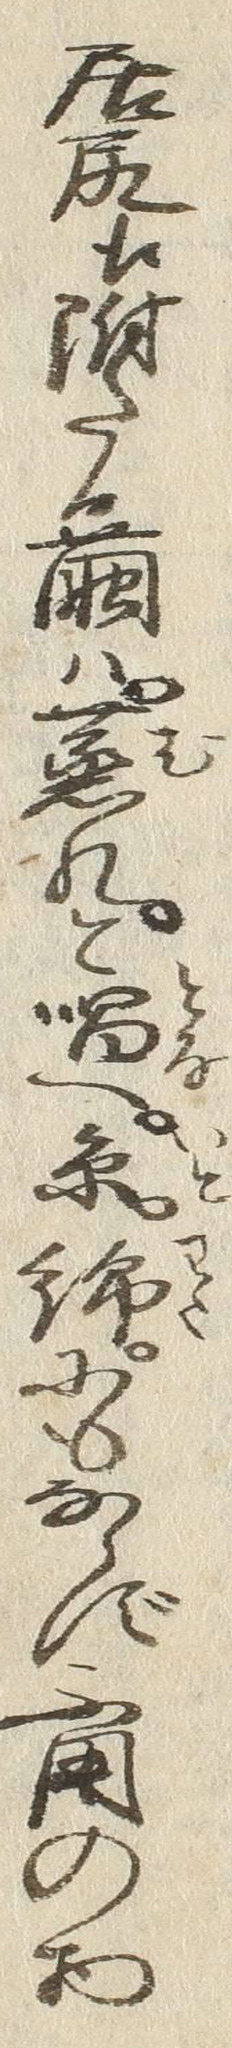居尻江附たる繭は。蒸れ。と唱へ。糸。綿。尓もならずふ用の物
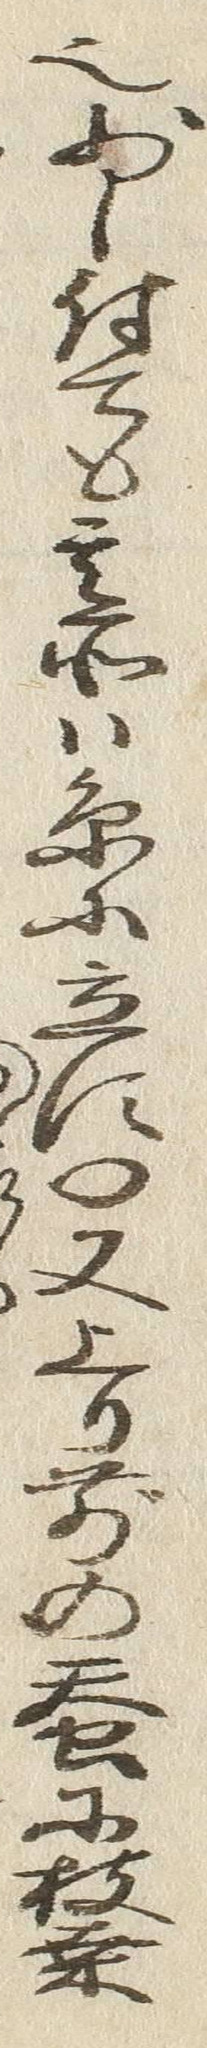也少し付ても其所は糸尓立須〇又上り前の蚕尓枝桑
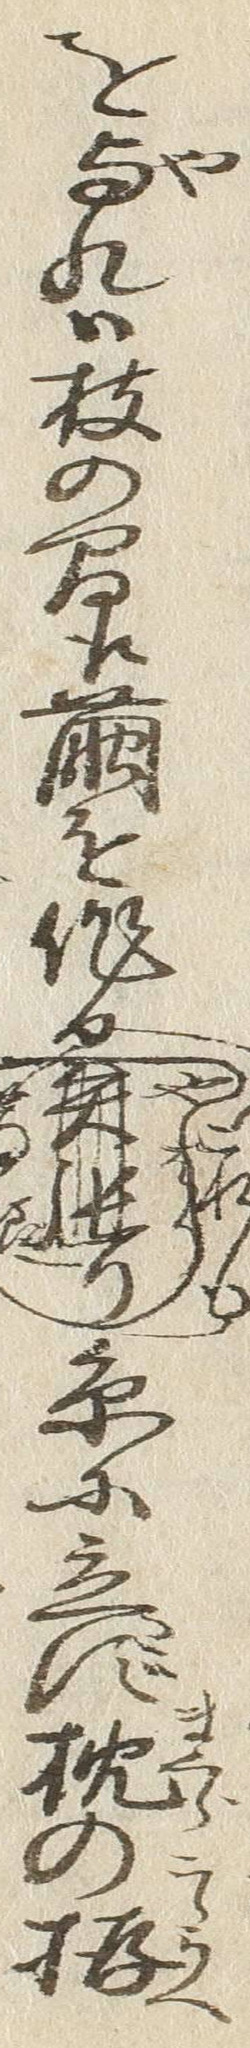を与れは枝の間江繭を作るこれもやはり糸尓立ず枕の拵
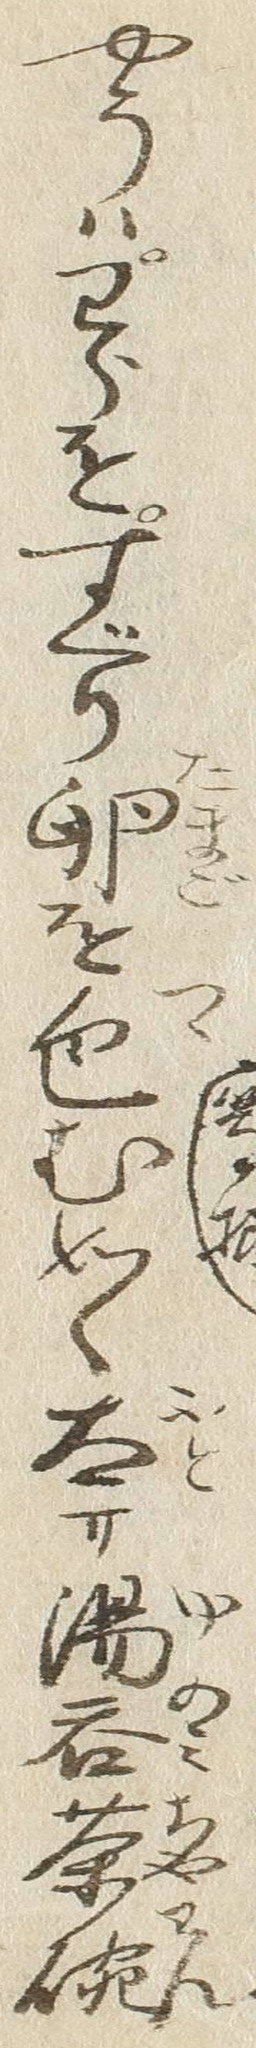やうは。わらを。すぐり卵を包む如く太サ湯呑茶碗
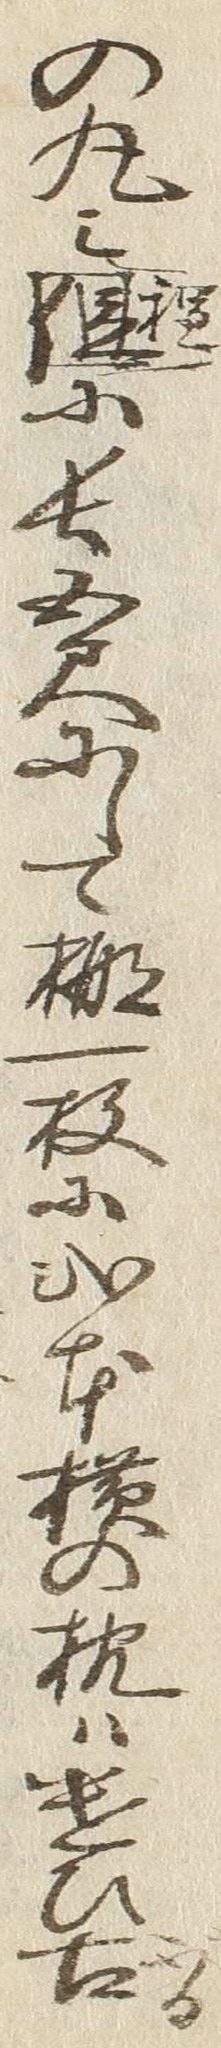の丸み程尓長五尺尓して棚一枚尓弐本横の枕は遣ひ古
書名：養蠶實驗録後編
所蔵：東京大学農学生命科学図書館 国文学研究資料館
